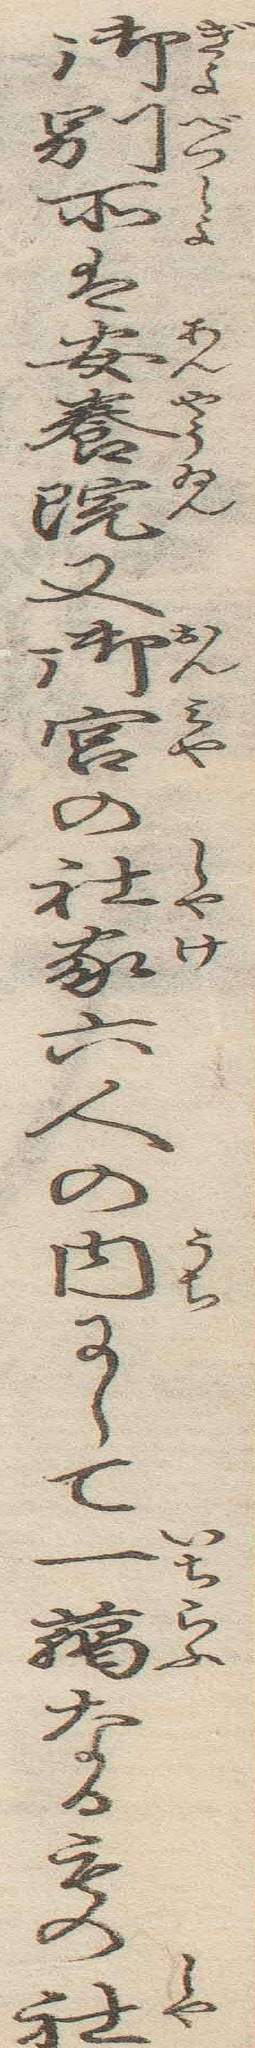御別所は安養院又御宮の社家六人の内にして一﨟なるもの社
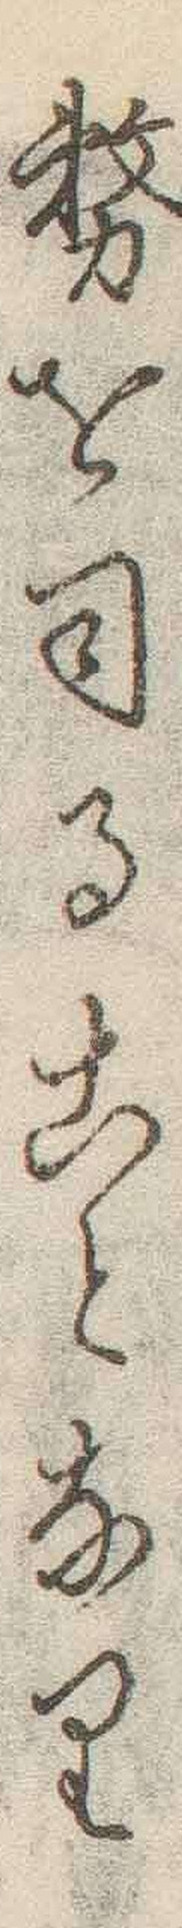務を司ることなり
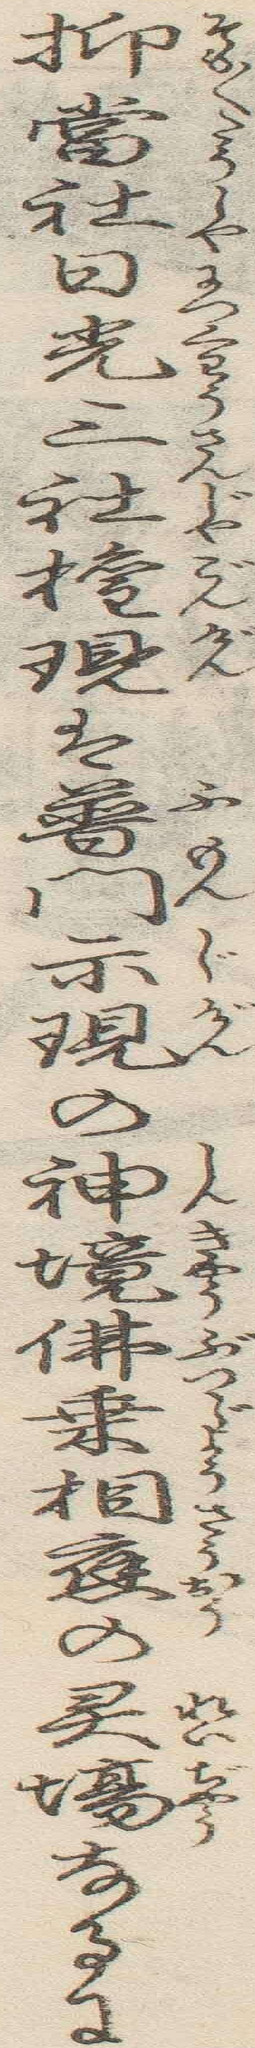抑當社日光三社權現は普門示現の神境佛乗相應の㚑塲なるに
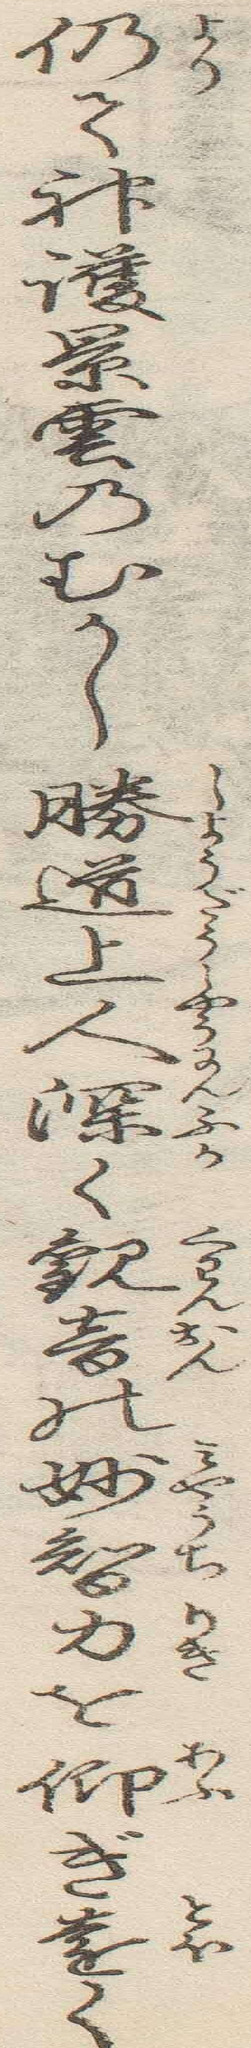仍て神護景雲のむかし勝道上人深く観音の妙智力を仰ぎ遠く
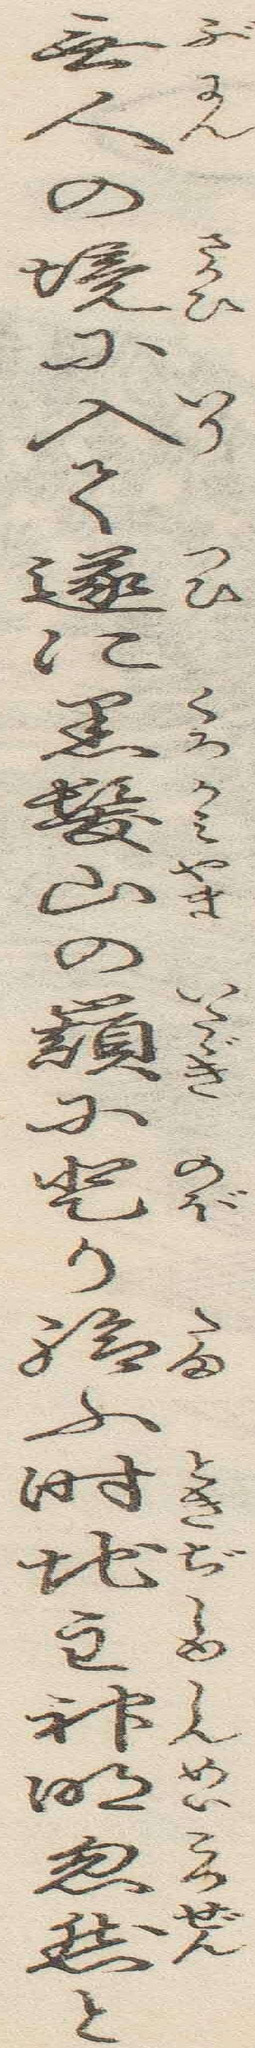無人の境に入て遂に黒髪山の巔に登り給ふ时地主神明忽然と
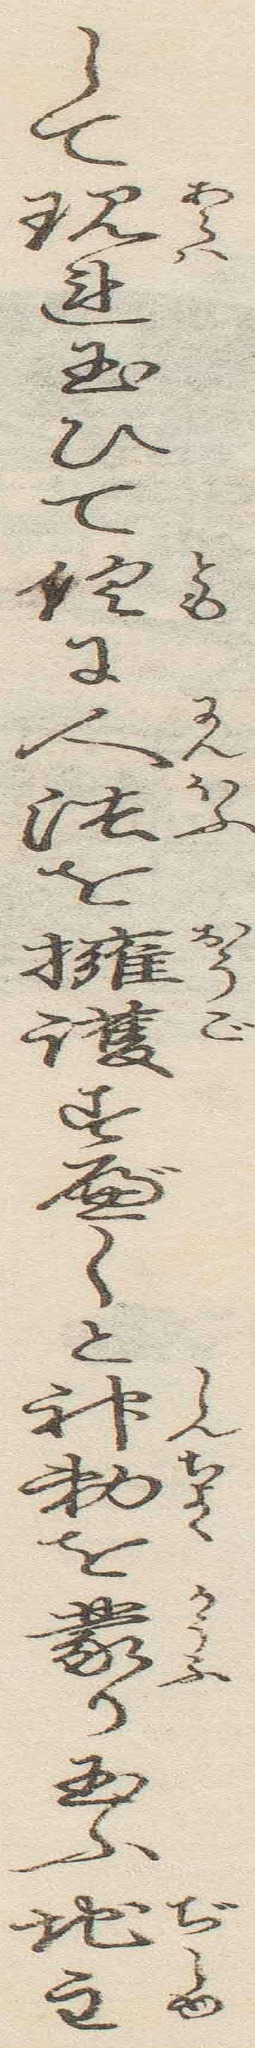して現れ玉ひて倶に人法を擁護すべし神勅を蒙り玉ふ地主
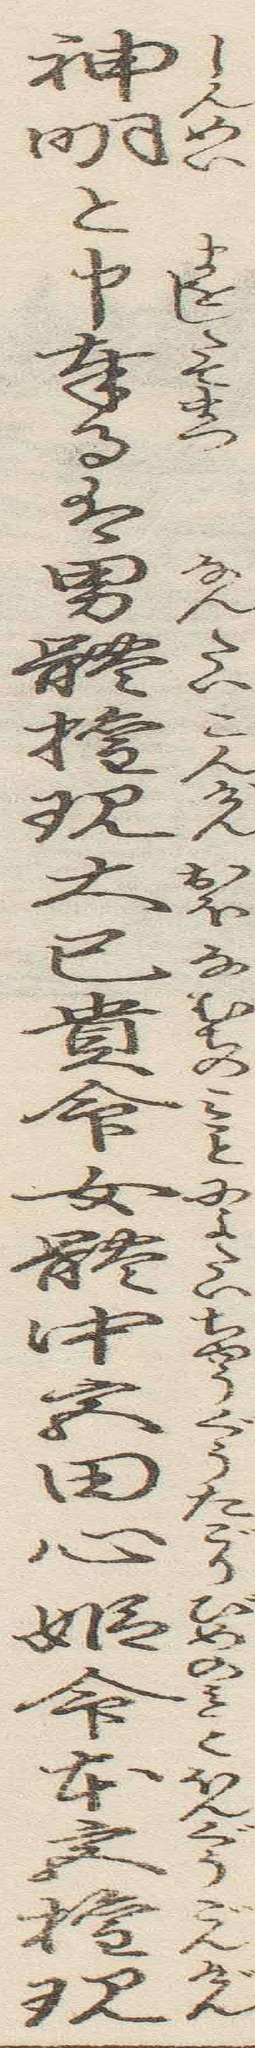神明と申奉るは男體權現大己貴命女體中宮田心姫命本宮權現
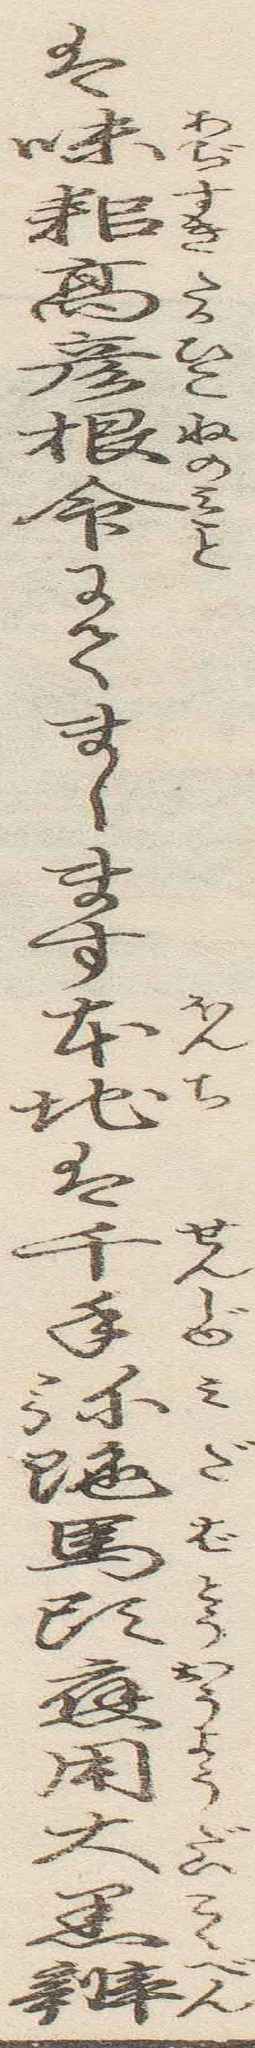は味耜高彦根命にてまします本地は千手弥陀馬頭應用大黒辨
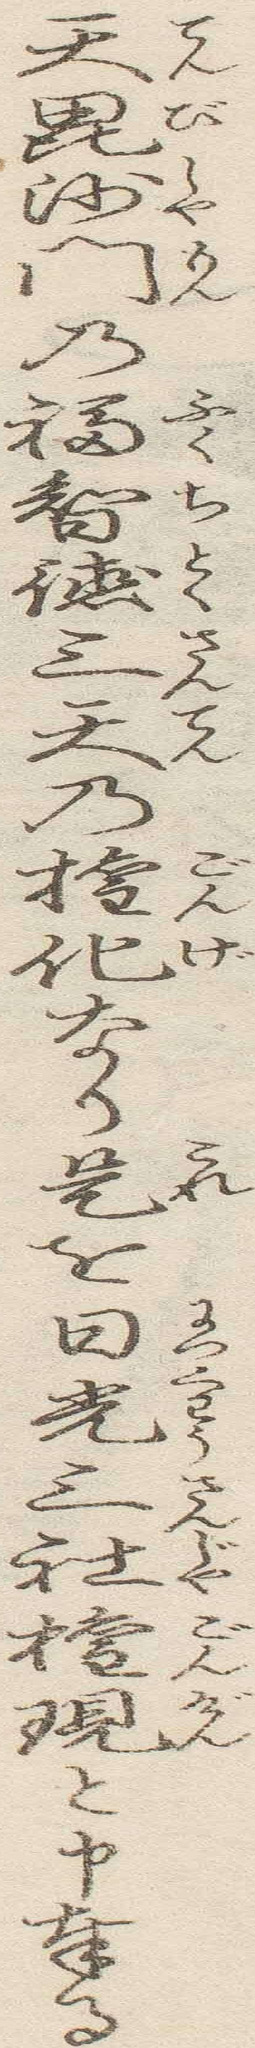天毘沙門の福智德三天の權化なり是を日光三社權現と申奉る
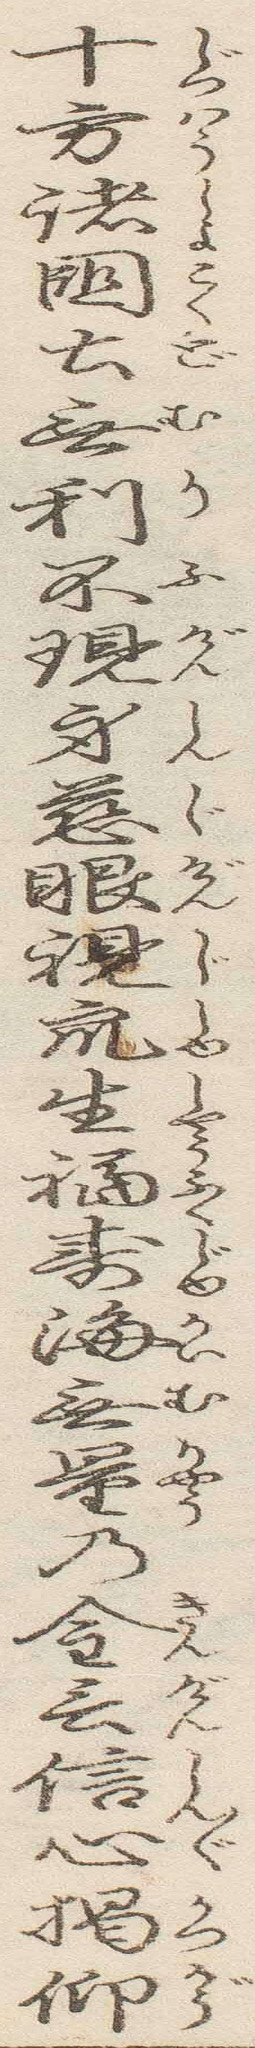十方諸國土無利不現身慈眼視衆生福寿海無量の金言信心掲仰
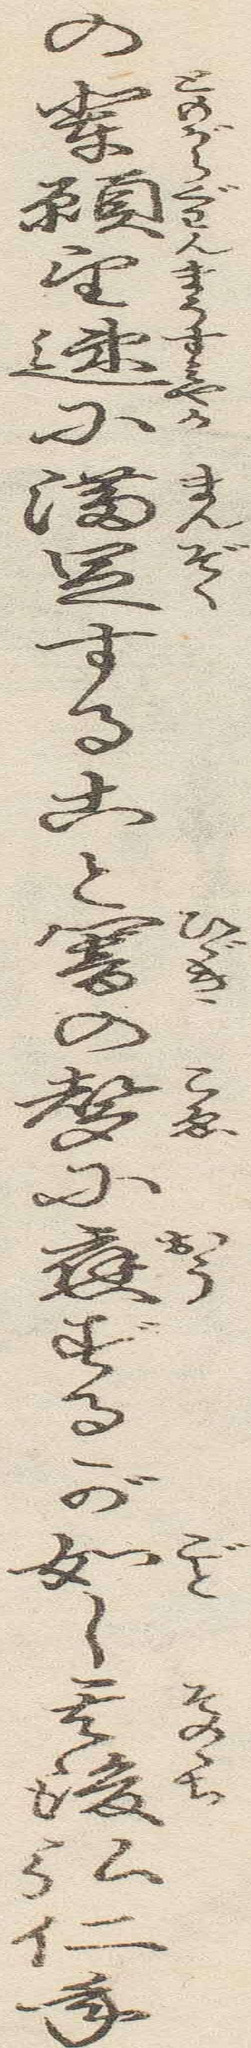の輩願望速に満足すること響の聲に應ずるが如し其後弘仁年
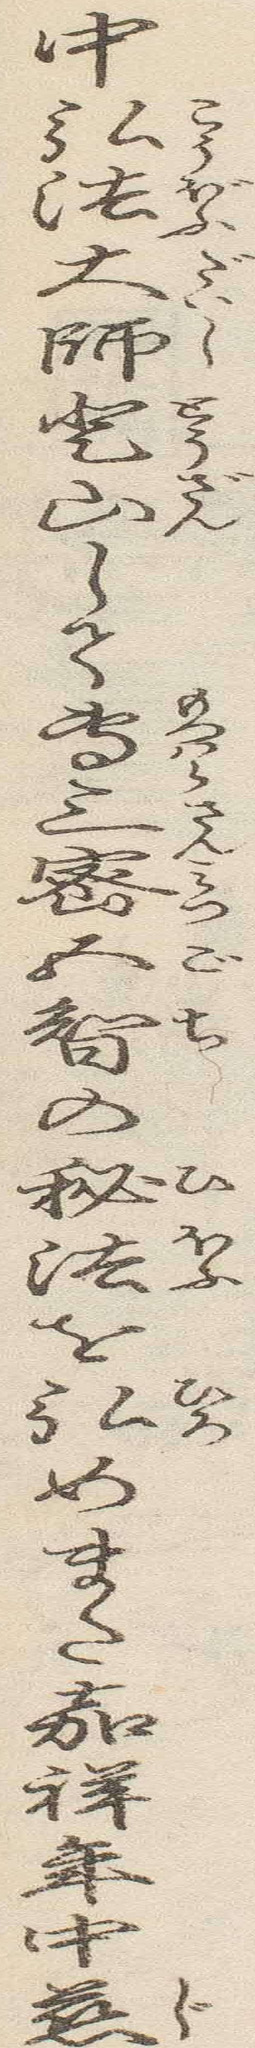中弘法大師登山して專三密五智の秘法を弘めまた嘉祥年中慈
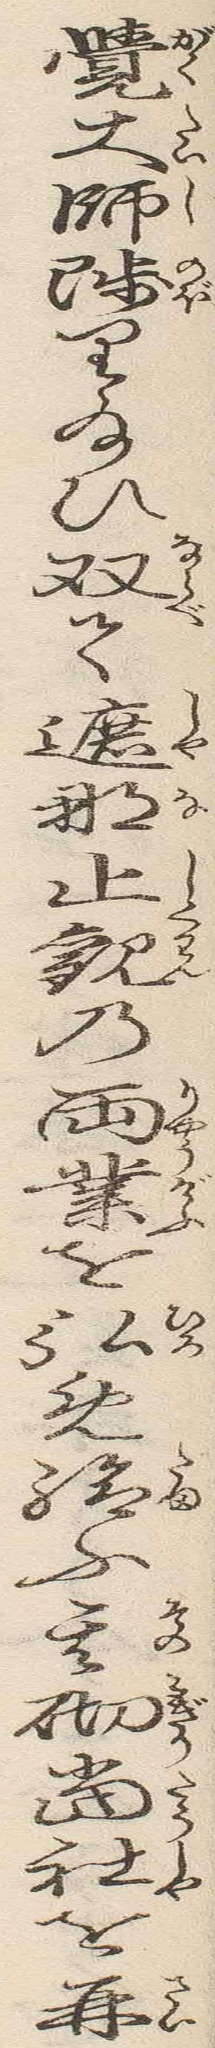覺大師陟り給ひ双て遮那止觀の両業を弘め給ふ其砌當社を再
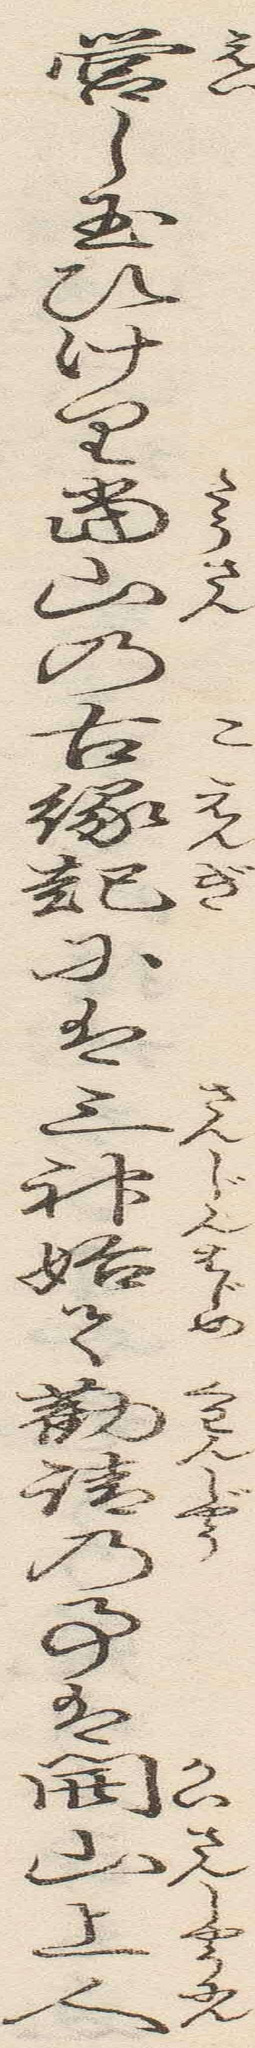営し玉ひけり當山の古縁起には三神始て勸請の事は開山上人
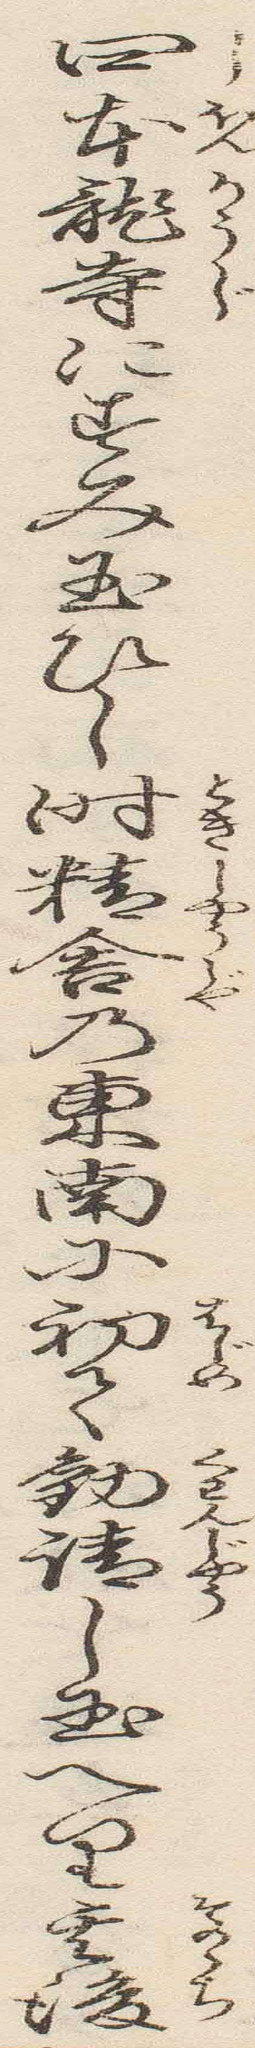四本龍寺にすみ玉ひし时精舎の東南に初て勸請し玉へり其後
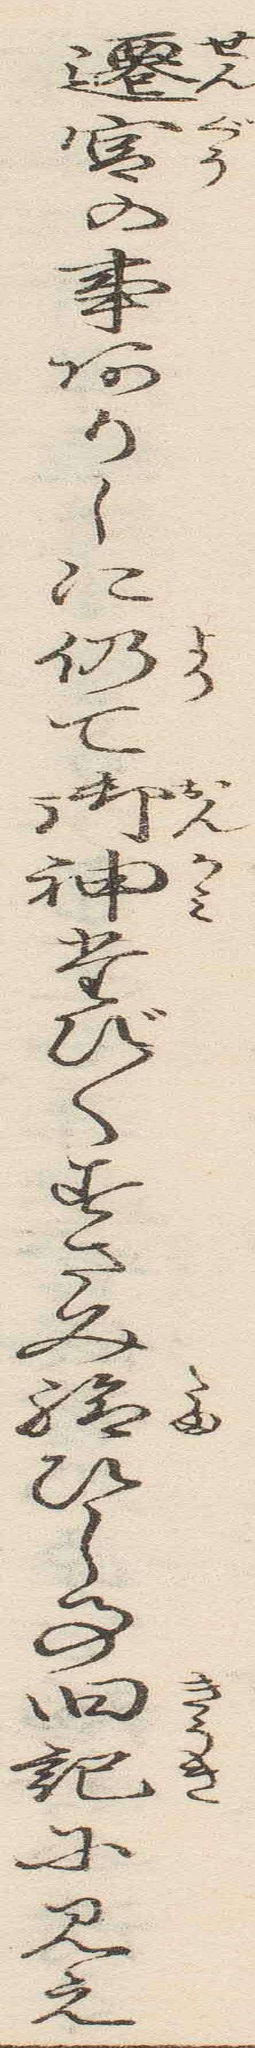遷宮の事ありしに仍て御神たび〳〵すさみ給ひし事旧記に見え
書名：日光山志
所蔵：東京学芸大学附属図書館 国文学研究資料館
